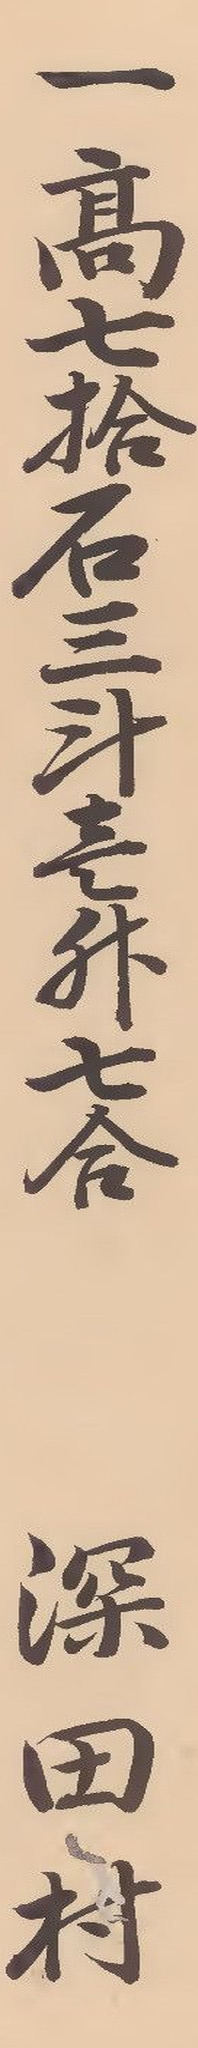一高七拾石三斗壱升七合深田村
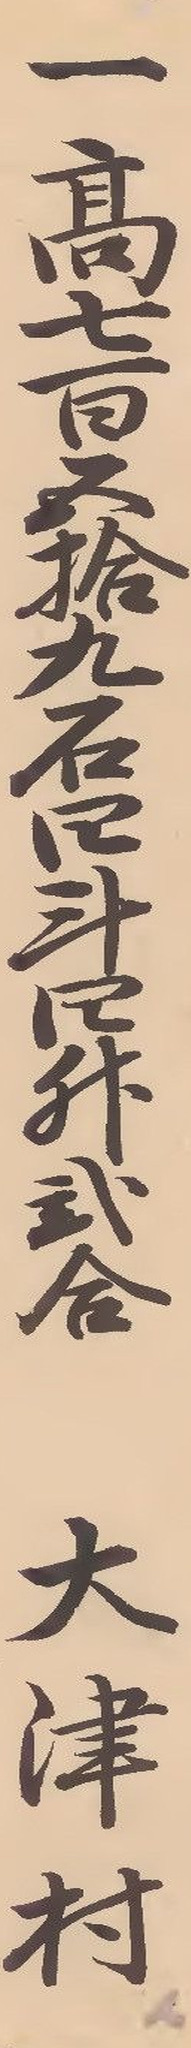一高七百五拾九石四斗四升弐合大津村
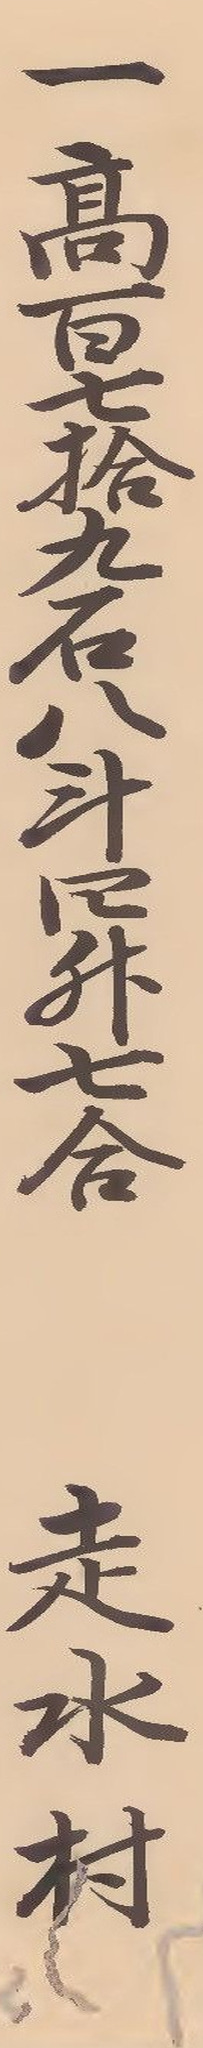一高百七拾九石八斗四升七合走水村
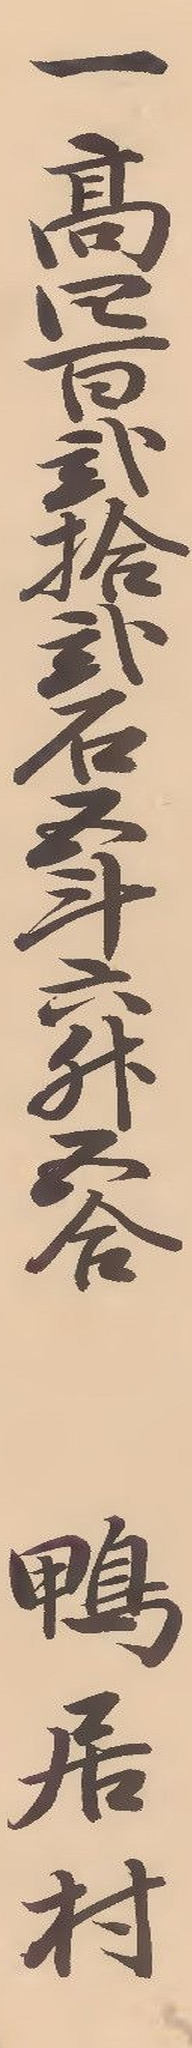一高四百弐拾弐石五斗六升五合鴨居村
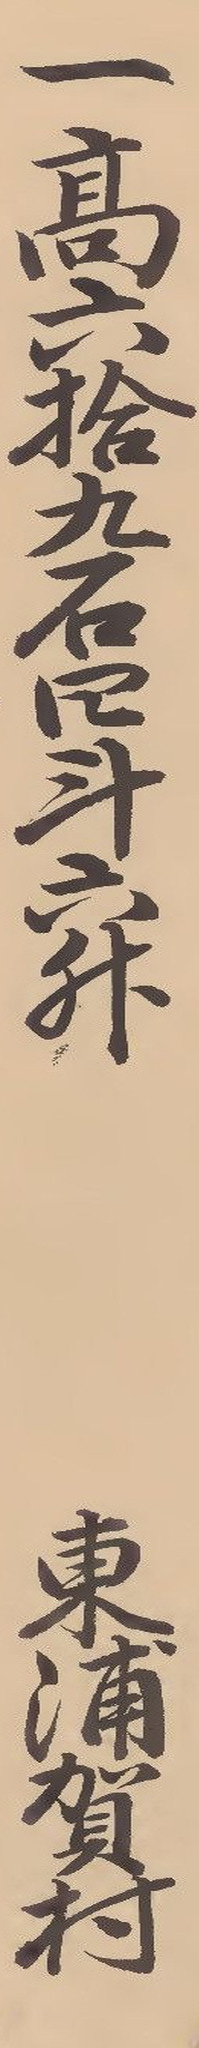一高六拾九石四斗六升東浦賀村
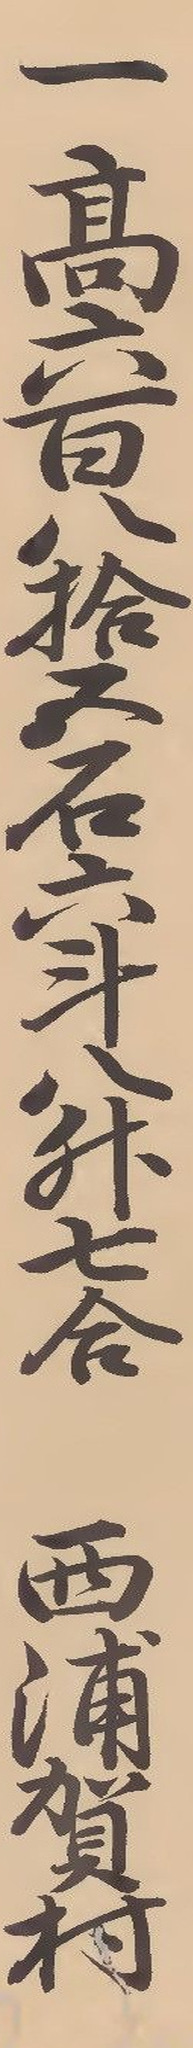一高六百八拾五石六斗八升七合西浦賀村
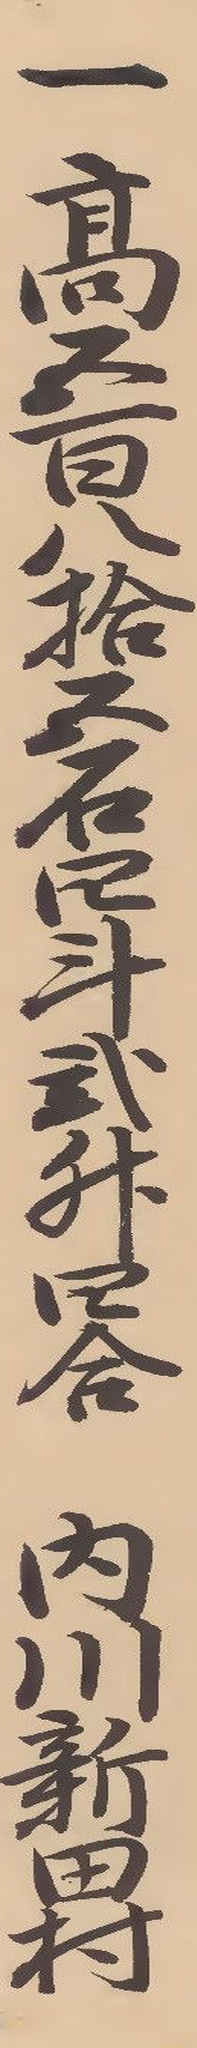一高五百八拾五石四斗弐升四合内川新田村
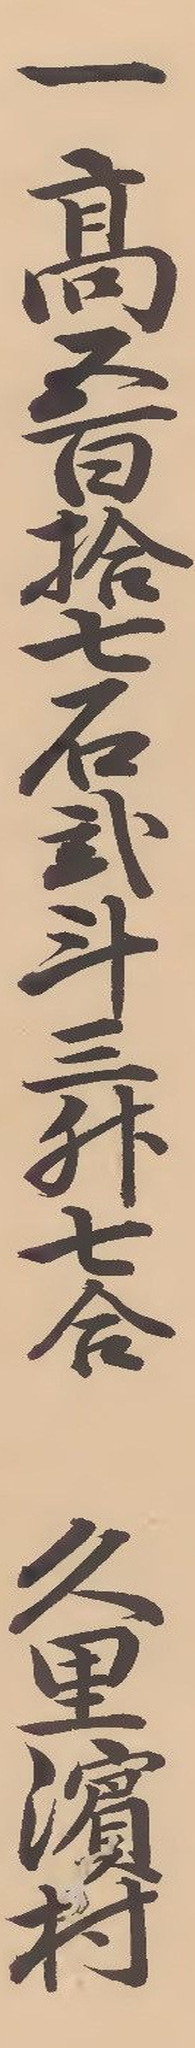一高五百拾七石弐斗三升七合久里濱村

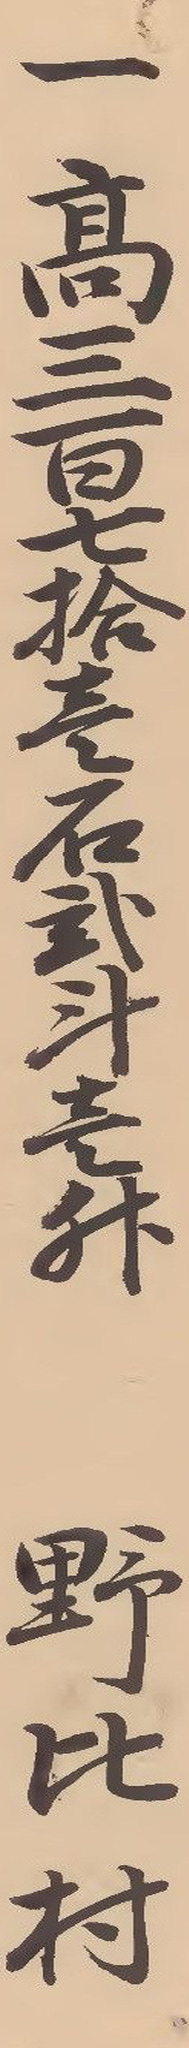一高三百七拾壱石弐斗壱升野比村
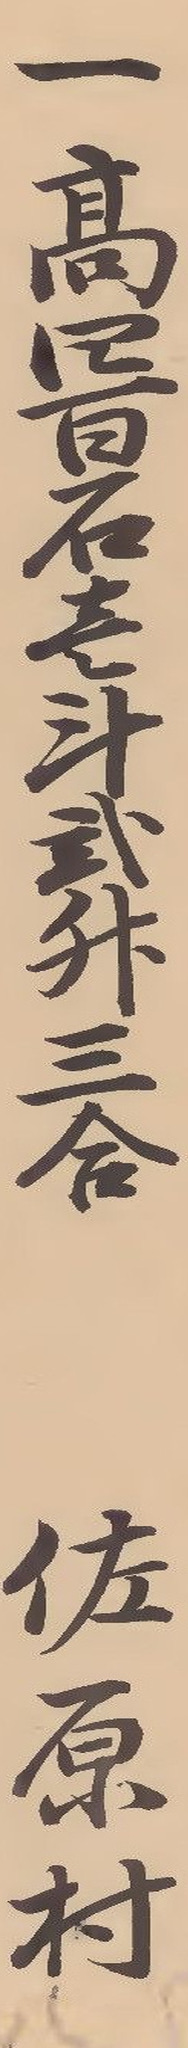一高四百石壱斗弐升三合佐原村
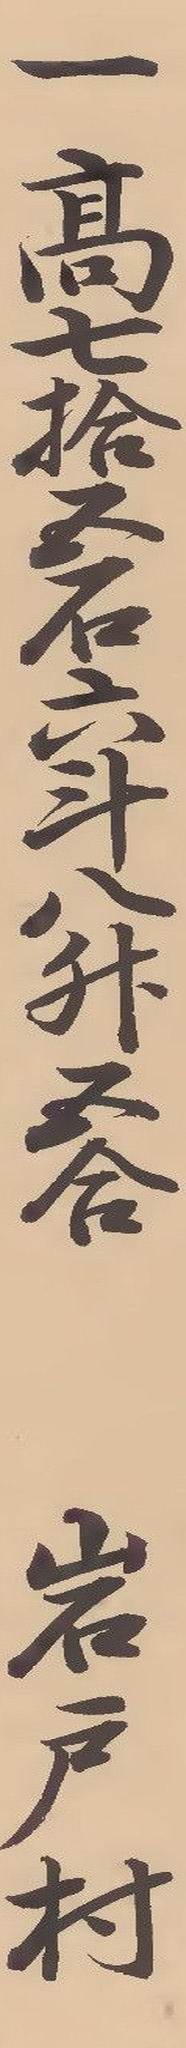一高七拾五石六斗八升五合岩戸村
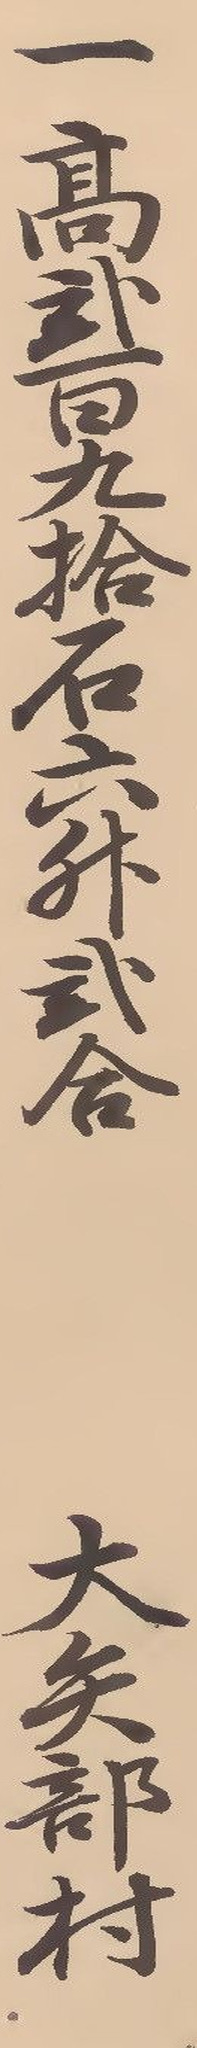一高弐百九拾石六升弐合大矢部村
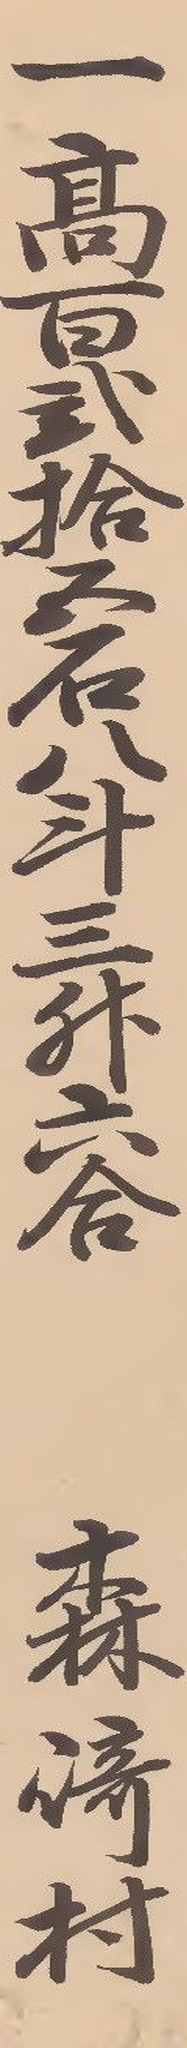一高百弐拾五石八斗三升六合森崎村
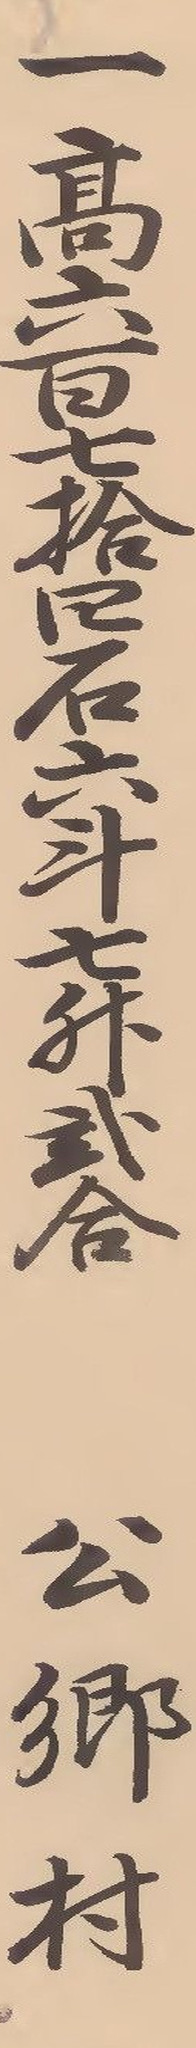一高六百七拾四石六斗七升弐合公郷村

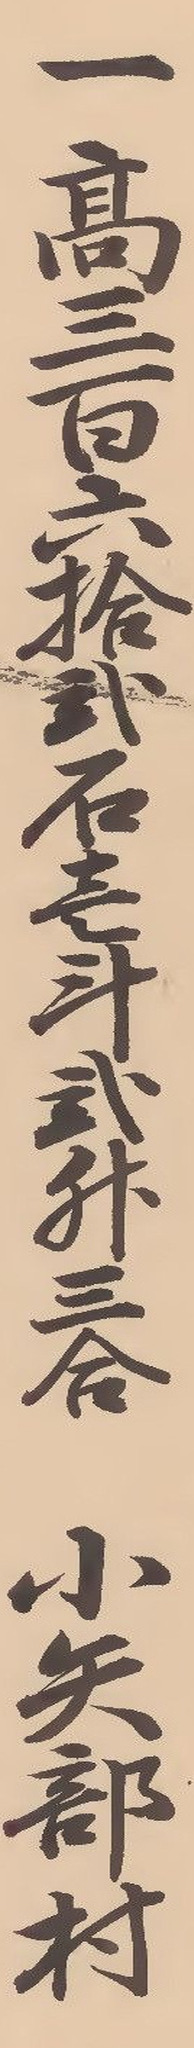一高三百六拾弐石壱斗弐升三合小矢部村
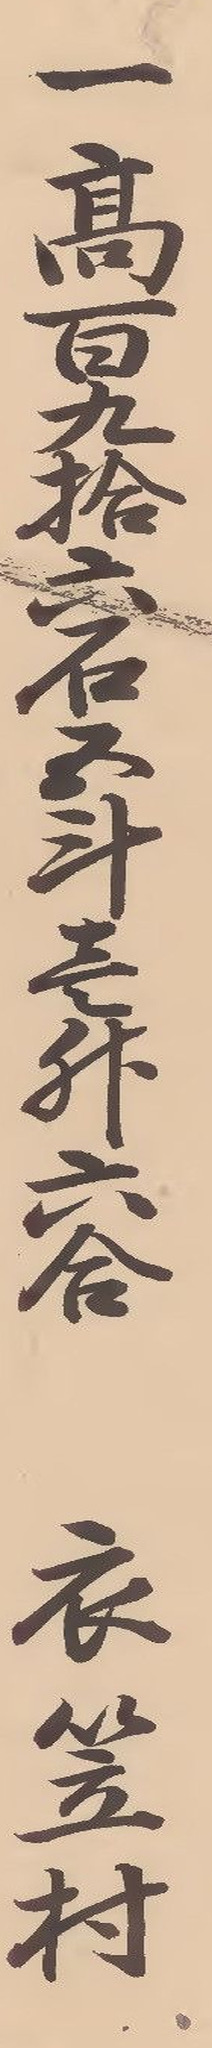一高百九拾六石五斗壱升六合衣笠村
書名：相模国郷帳
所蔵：国立公文書館 National Archives of Japan
